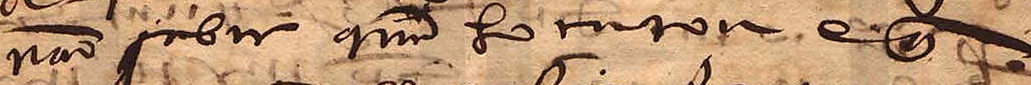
não sabee quē ho curou e q̄
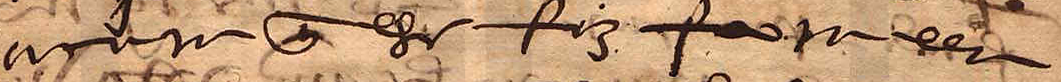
a cura q̄ lhe fez fora lla
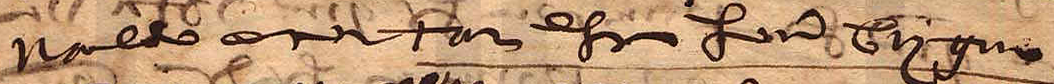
uallo e cortar lhe o ēbyguo
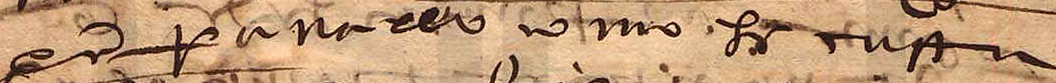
e ēpanallo como he custu
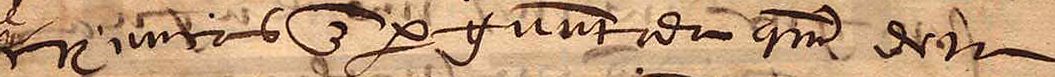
cryencas item ꝑgun̄tada quē dera
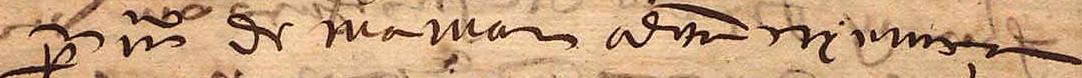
prmro de mamar a dita cryença
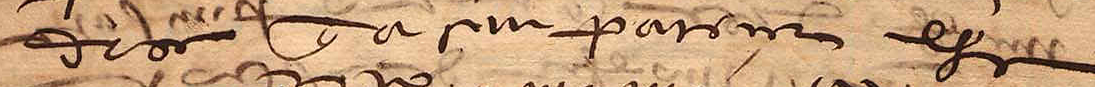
dyse q̄ a seu pareçer lhe
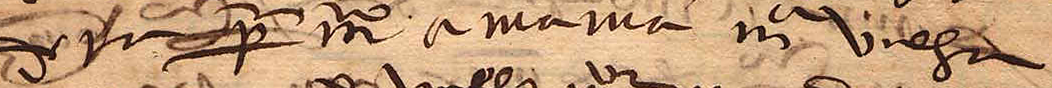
dera prmro a mama ma velha
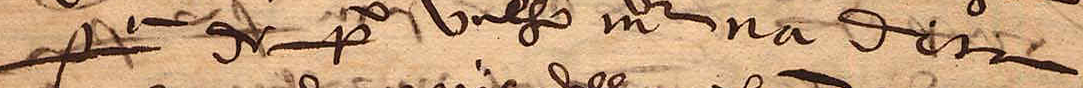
fa de po velho mor na dita
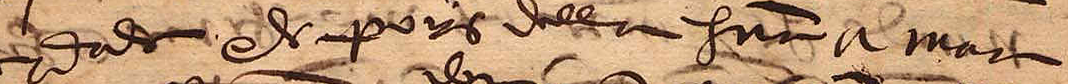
cydade e depoys della huā amaa
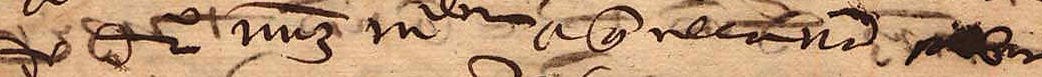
de dio nūz mdor a q̄ ella nā sabee
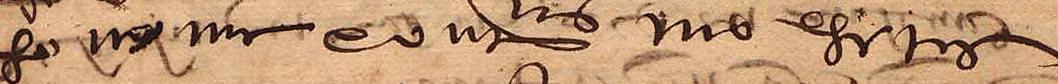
ho nome e outras molheres
